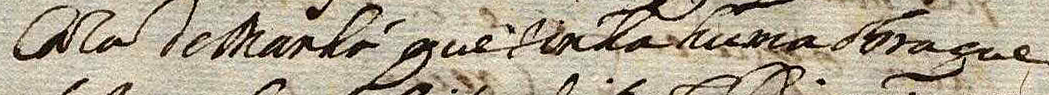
Caza de manhã que tinha huma obra que
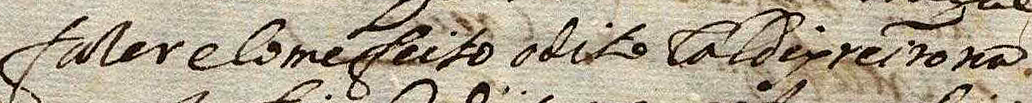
fazer e com efeito o dito Caldeyreiro na
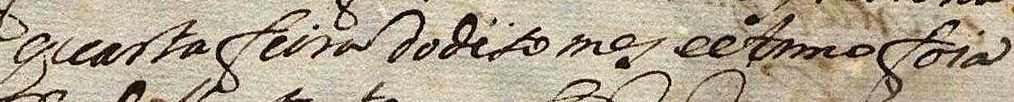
quarta feira do dito mes e Anno foi a
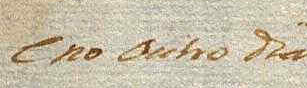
e no outro dia
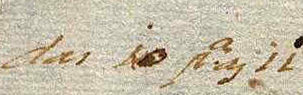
das i0 p.a as 11
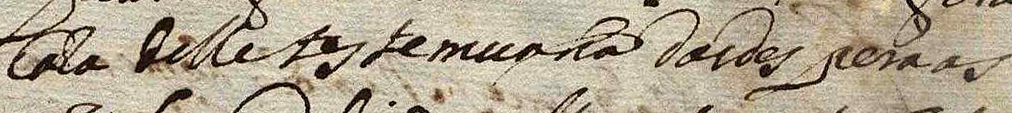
Caza delle testemunha das des pera as
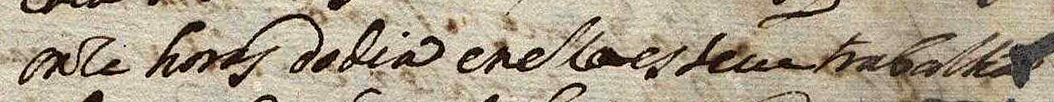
onze horas do dia e nella esteue trabalha
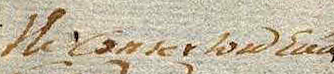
lhe consertou huā
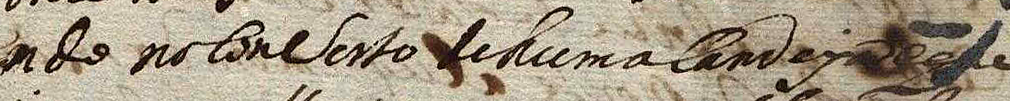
ndo no conSerto de huma Candeya e que
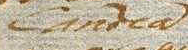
Candea
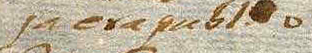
ja era publ.o o
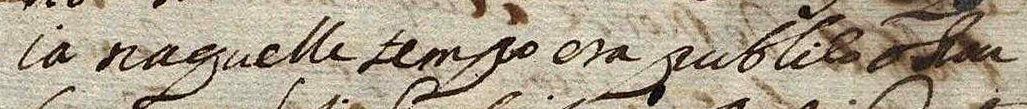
ia naquelle tempo era publico o Rou
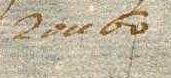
Roubo
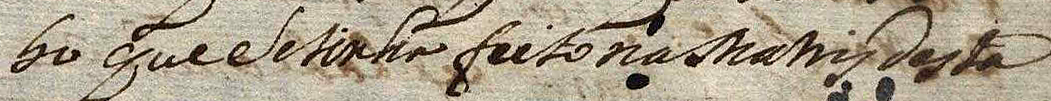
bo que Se tinha feito na Matris desta
